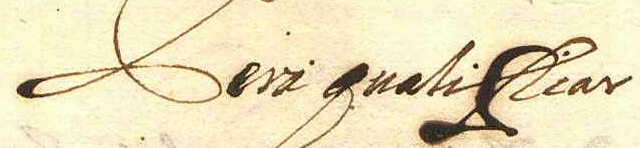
Pera qualificar
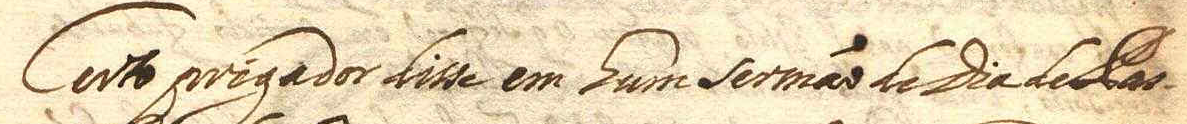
Certo pregador disse em hum sermaõ de Dia de Pas
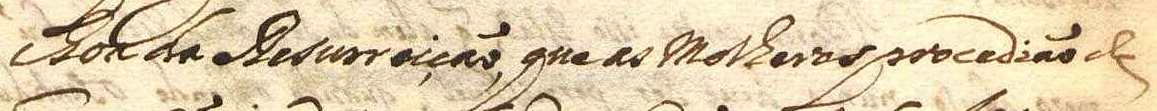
choa da Resurreiçaõ, que as molheres procediaõ de
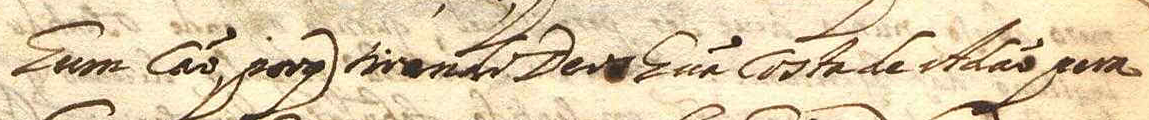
hum caõ, porq̄ tirando Deos huā Costa de Adaõ pera
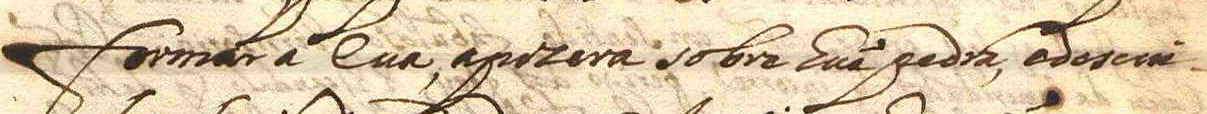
formar a Eua, a pozera sobre huā pedra, e descui
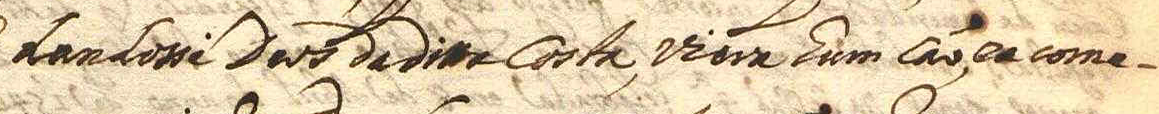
dandosse Deos da ditta Costa, viera hum caõ, e a come
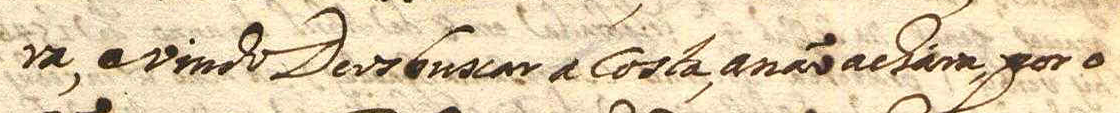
ra, e vindo Deos buscar a costa, a naõ achara, por o
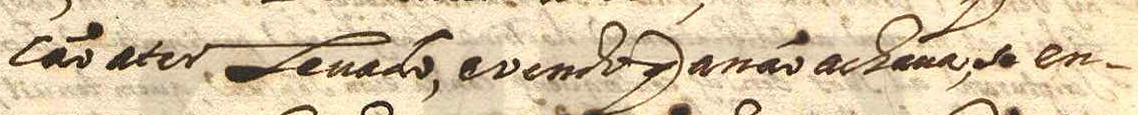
caõ a ter Leuado, e vendo q̄ a naõ achaua, se en
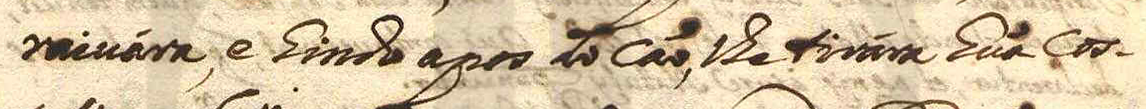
raiuára, e hindo apos do caõ, lhe tirára huā cos
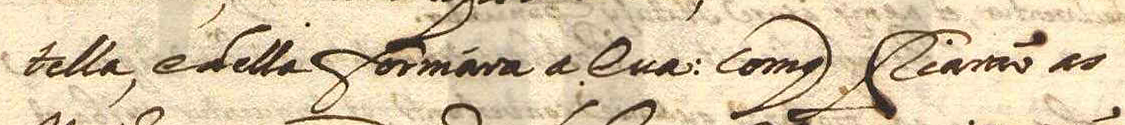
tella, e della formara a Eua: com q̄ ficaraõ as
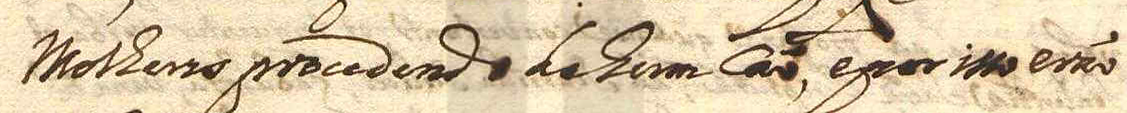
molheres procedendo de hum caõ, e por isso eraõ
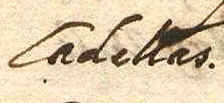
Cadellas.
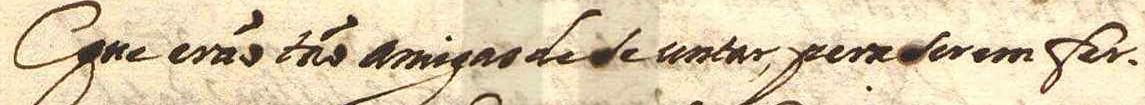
E que eraõ tão amigas de se untar, para serem fer
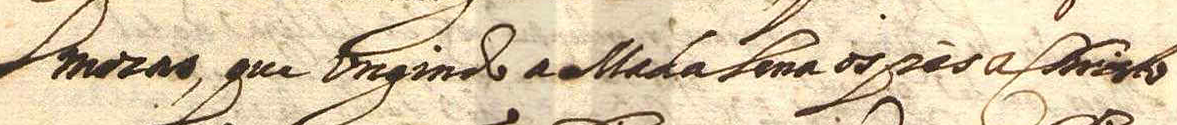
mozas, que vngindo a Madalena os pés a Christo
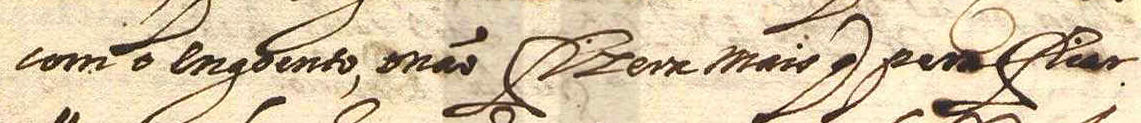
com o engoento, o naõ fizera mais q̄ pera ficar
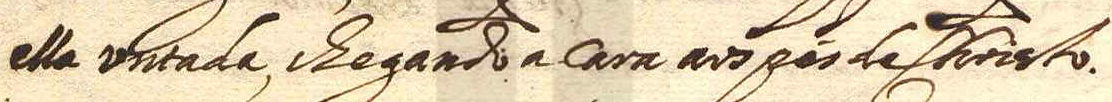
ella vntada, chegando a cara aos pés de Christo.
